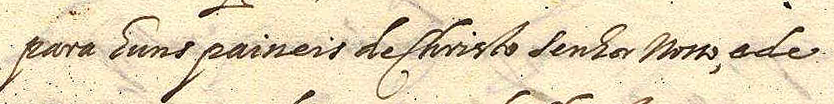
para huns paineis de Christo Senhor nosso, e de
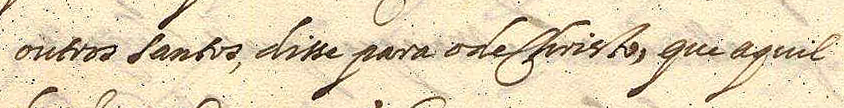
outros santos, disse para o de Christo, que aquil
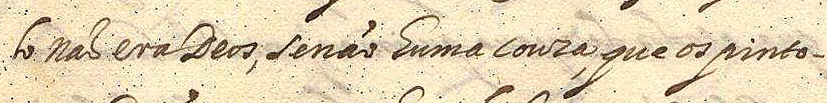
to naõ era Deos, senaõ huma couza, que os pinto
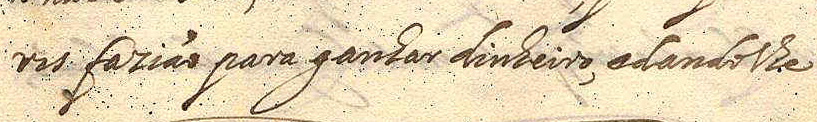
res faziaõ para ganhar dinheiro, e dandolhe
